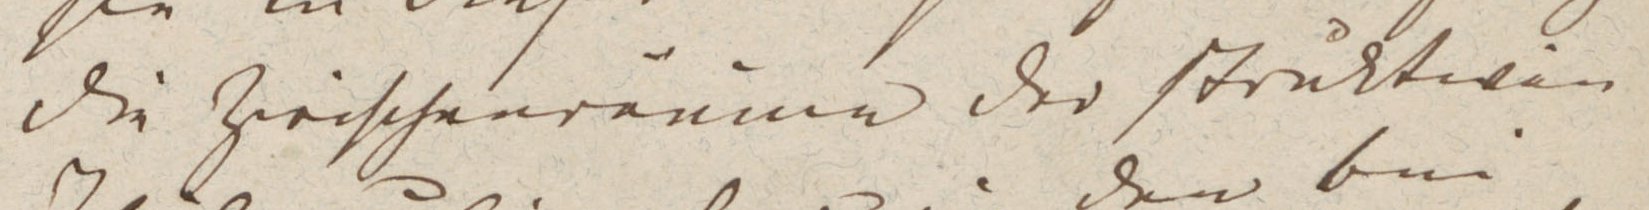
die Zwischenräume der struktiven
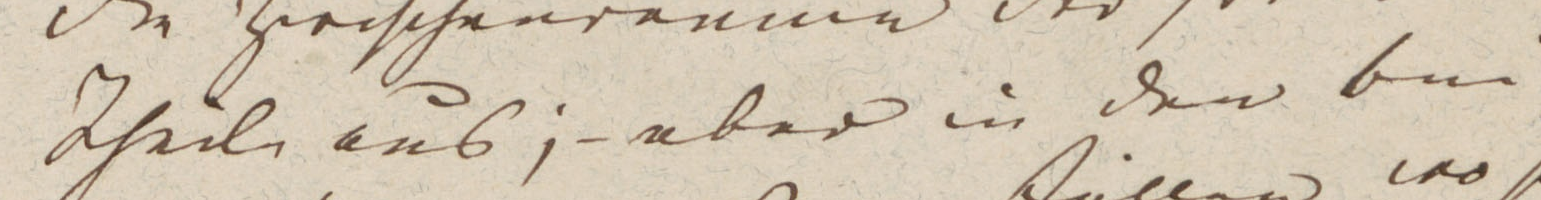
Theile aus; - aber in den bei
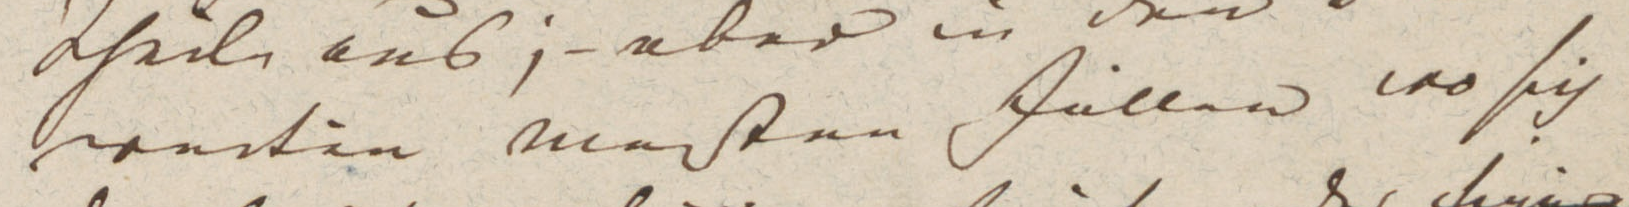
weiten meisten Fällen wo sich
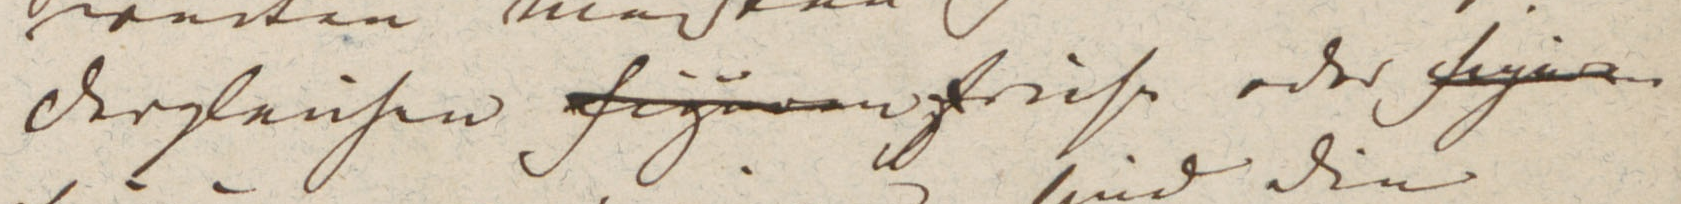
dergleichen FigurenfFriese oder Figuren
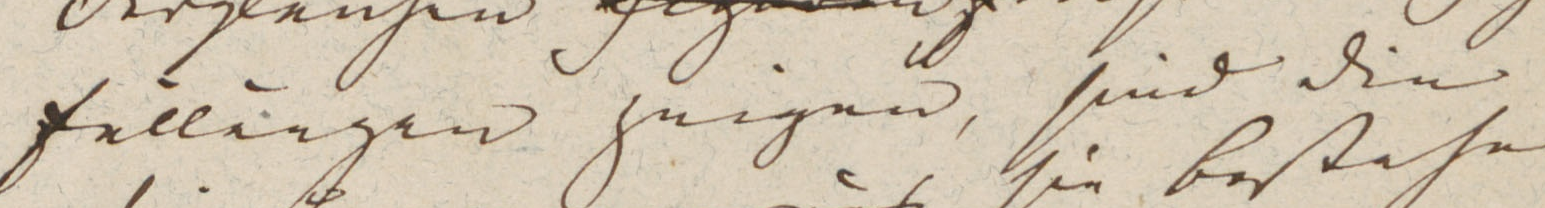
fFüllungen zeigen, sind die
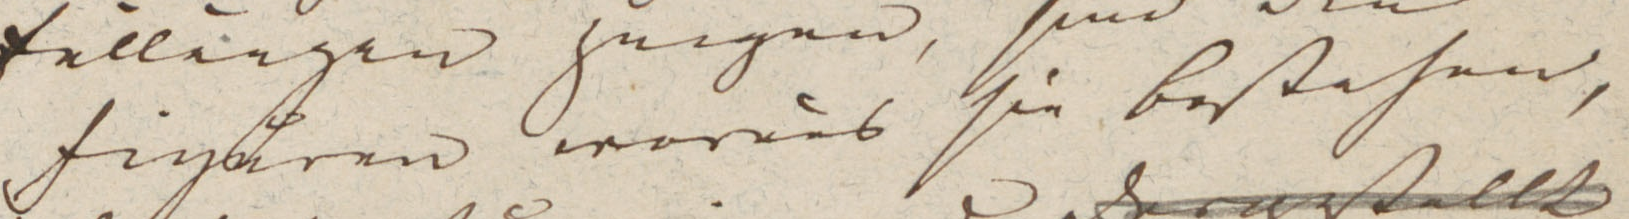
Figuren woraus sie bestehen,
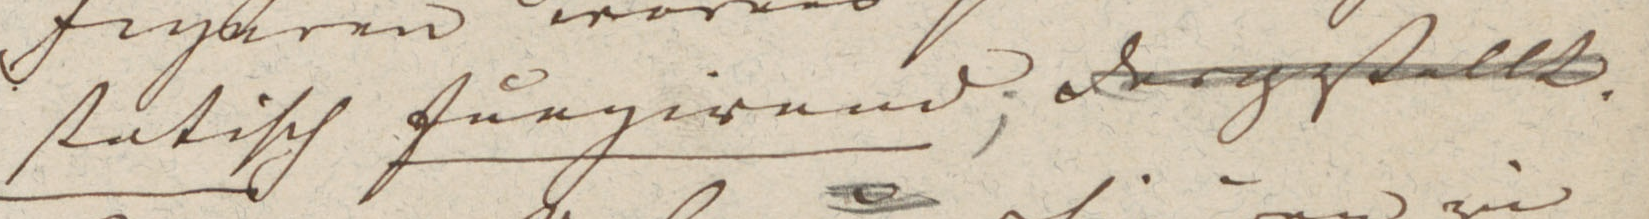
statisch fungirend; dargestellt.
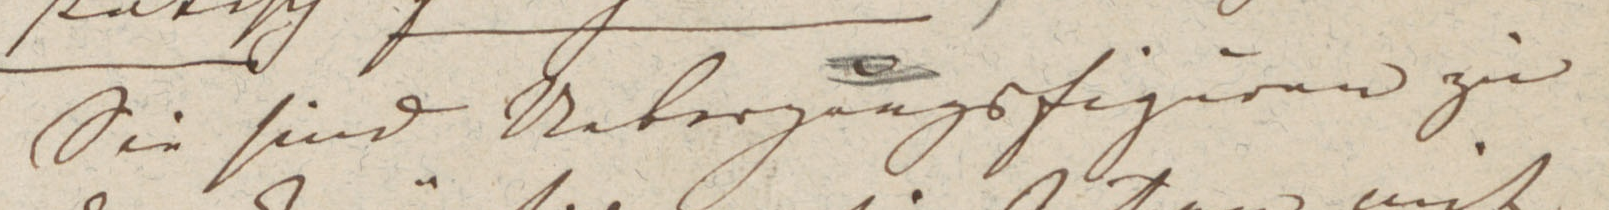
Sie sind Ueberguangsfiguren zu
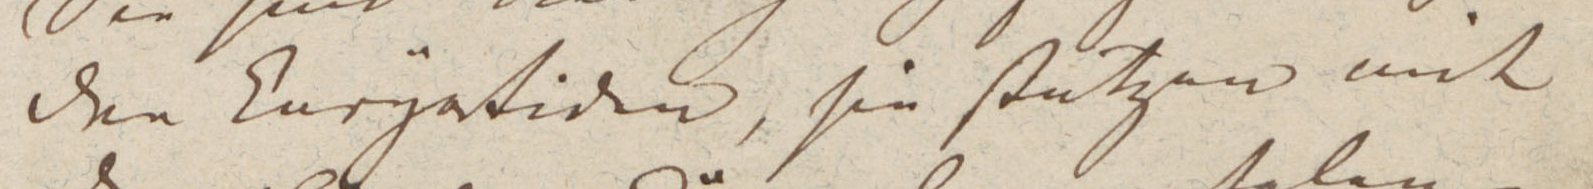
den Caryatiden, sie stützen mit
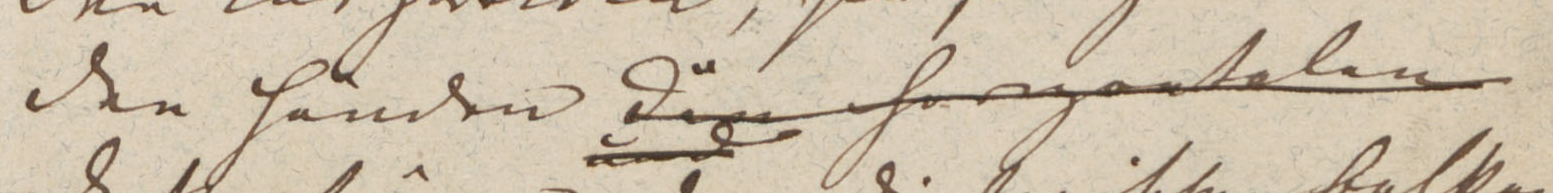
den Händen die horizontalen
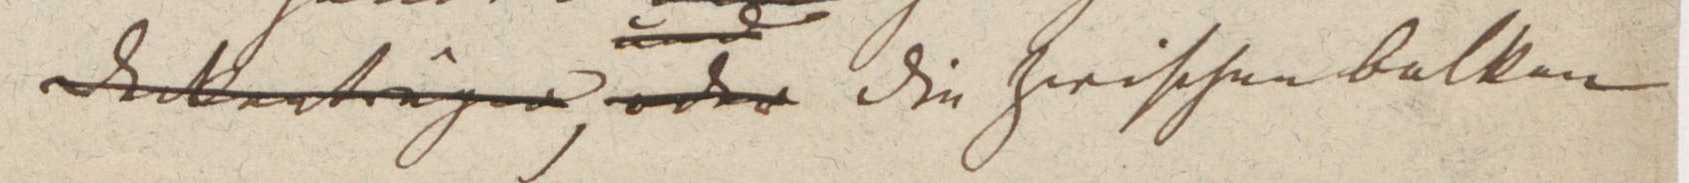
Deckenträger, oder und die Zwischenbalken
